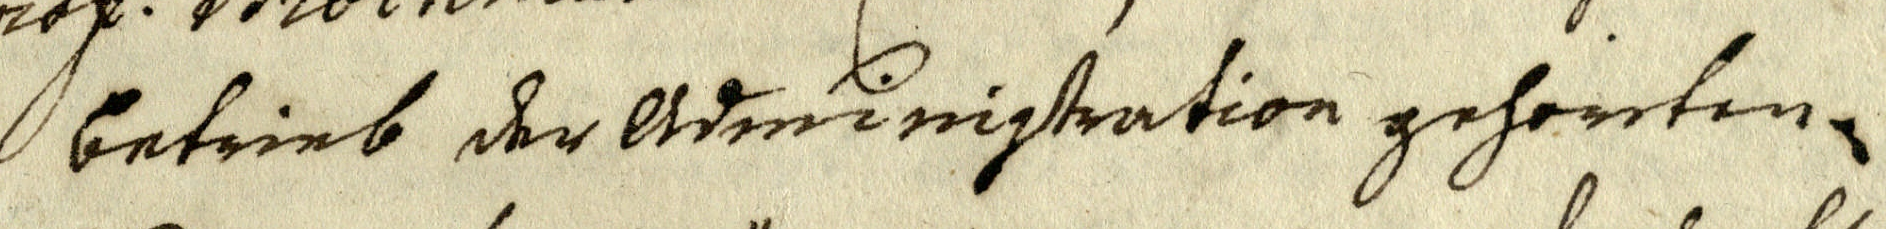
Betrieb der Administration gehörten.
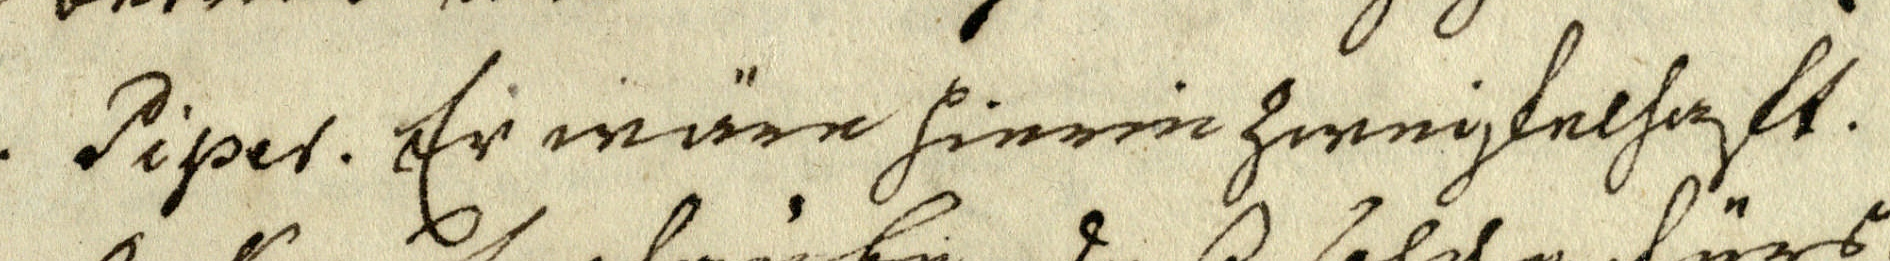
Piper. Er wäre hierin zweifelhaft.
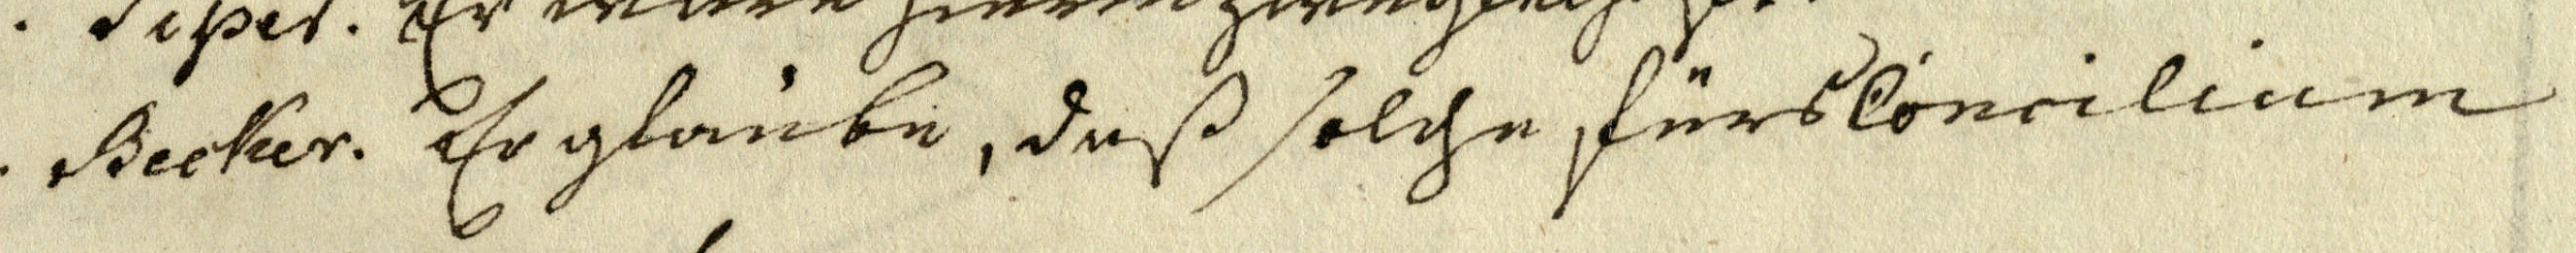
Becker. Er glaube, daß solche fürs Concilium
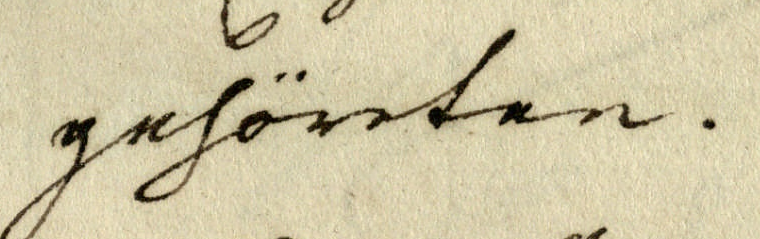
gehöreten.
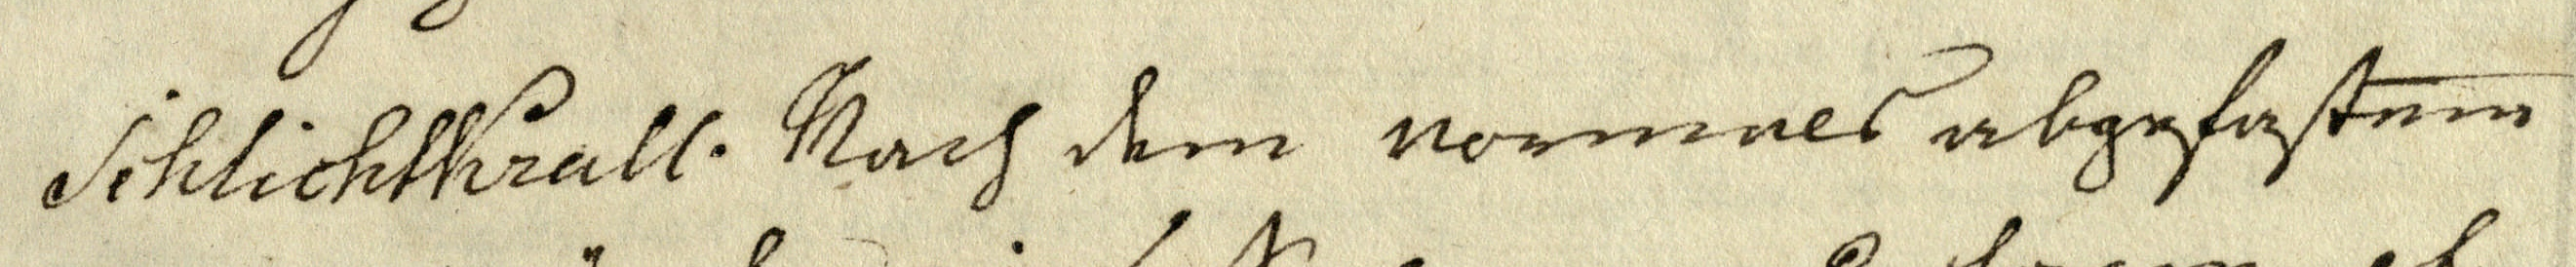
Schlichtkrull. Nach dem vormals abgefaßtem
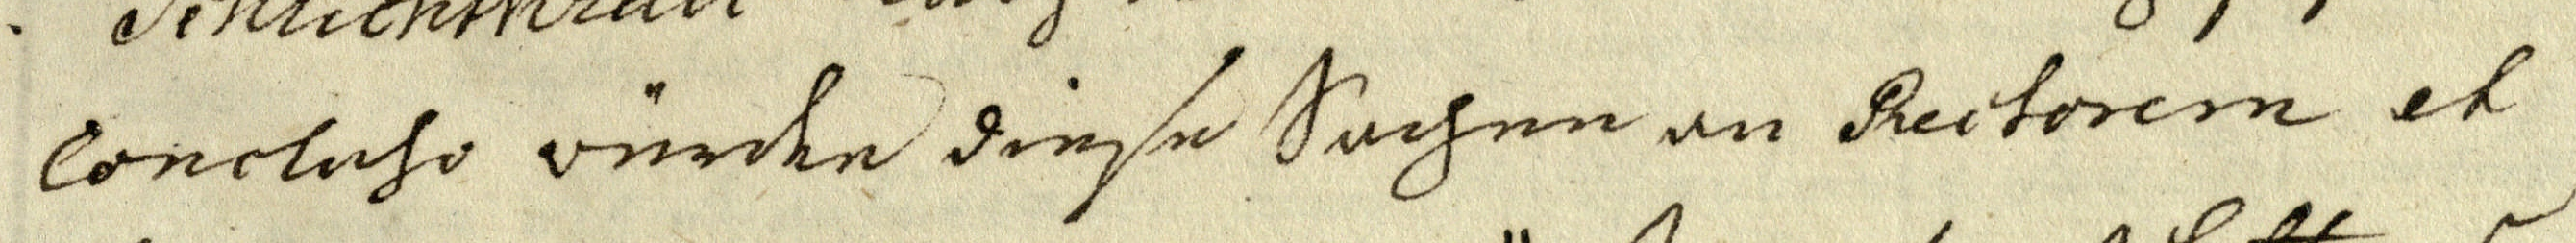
Concluso würden diese Sachen an Rectorem et
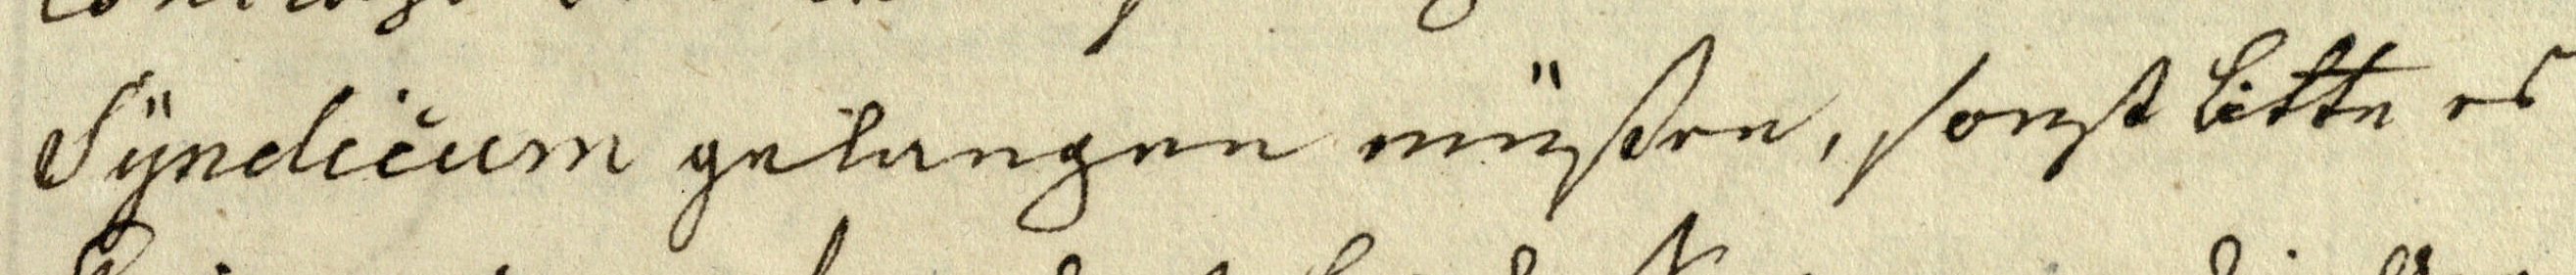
Sÿndicum gelangen müßten, sonst litte es
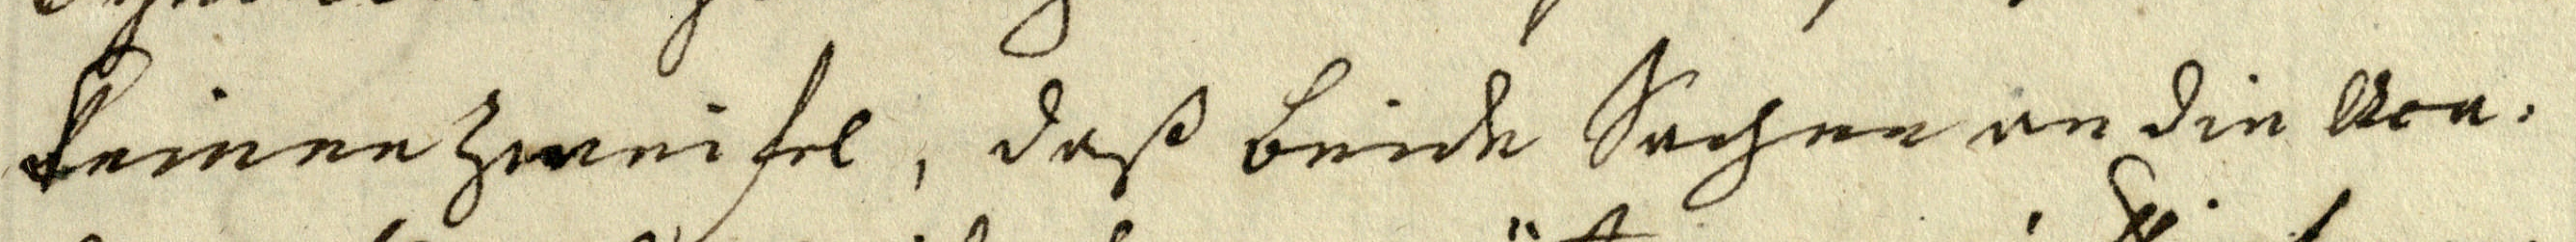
keinen Zweifel, daß beide Sachen an die Aca¬
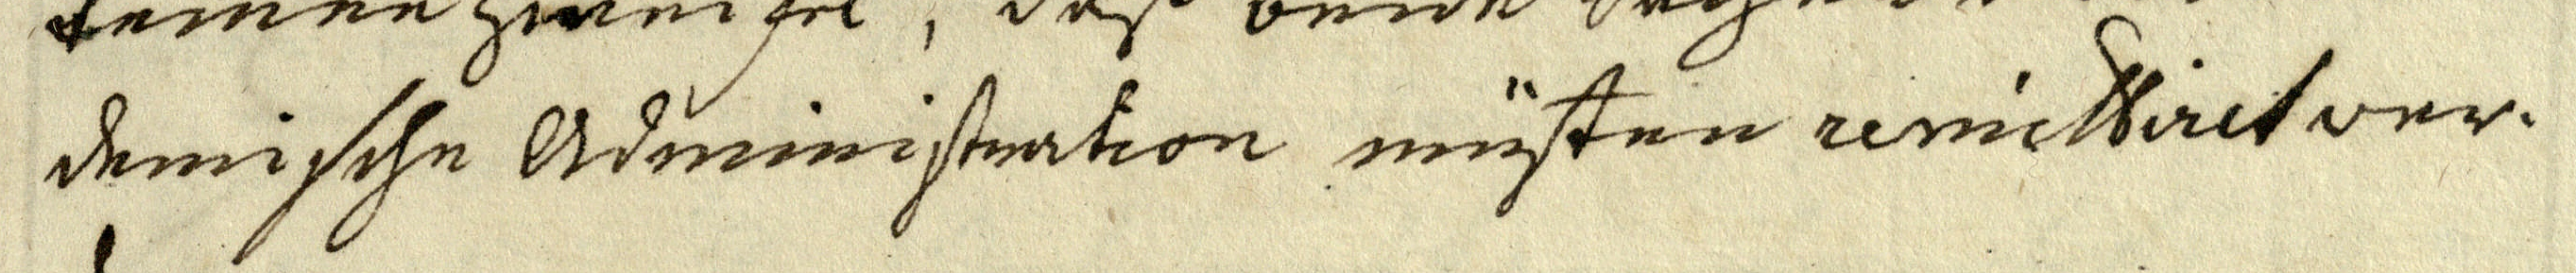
demische Administration müßten remittiret wer¬
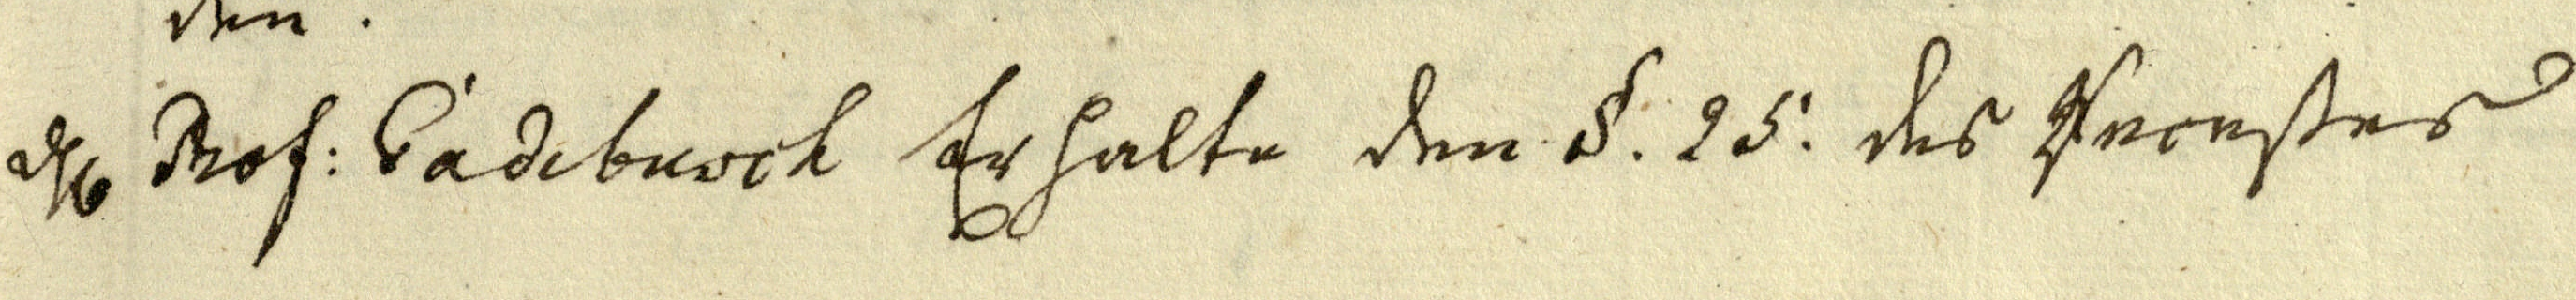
dh. Prof. Gadebusch Er halte dem §. 25. des Recesses
